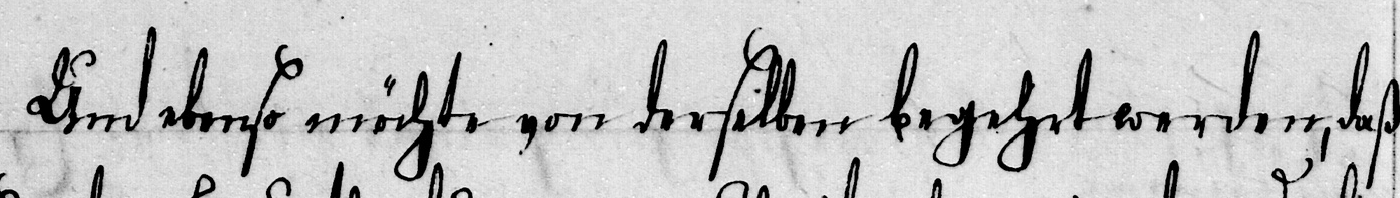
Und ebenso möchte von derselben begehrt werden, daß
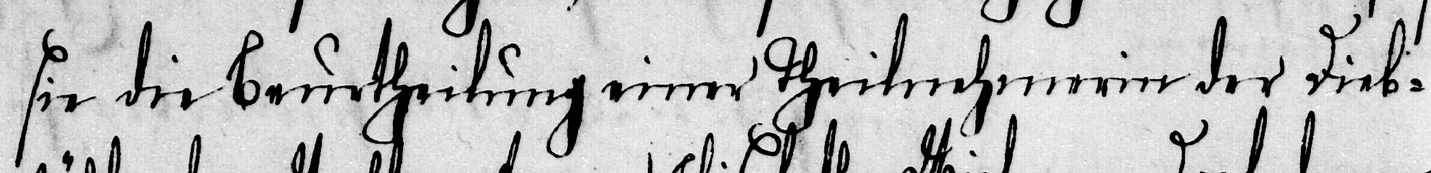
sie die Beurtheilung einer Theilnehmerin der Dieb¬
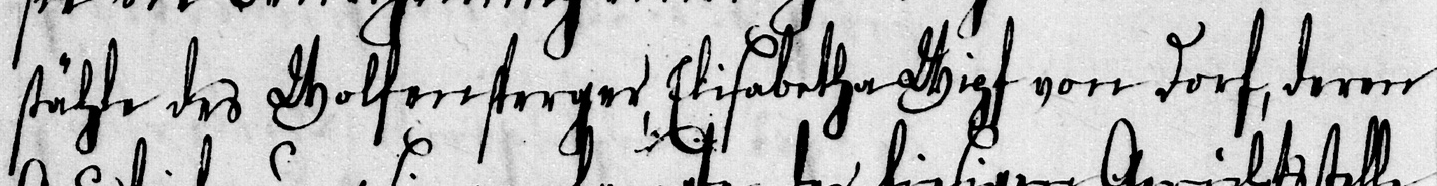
stähle des Wolfensperger, Elisabetha Wipf von Dorf, deren
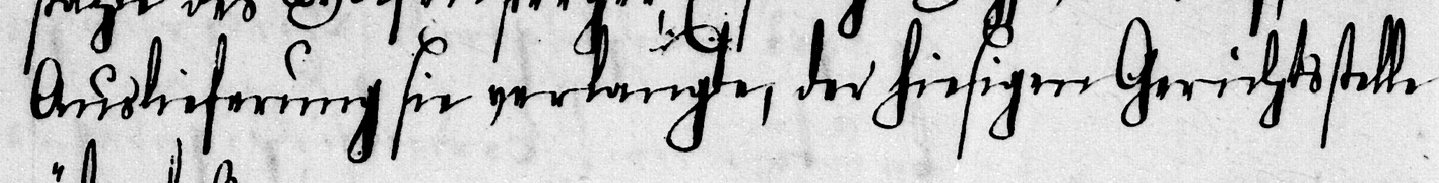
Auslieferung sie verlangte, der hiesigen Gerichtsstelle
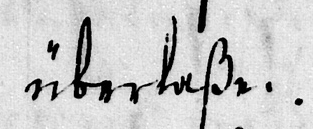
überlaße.
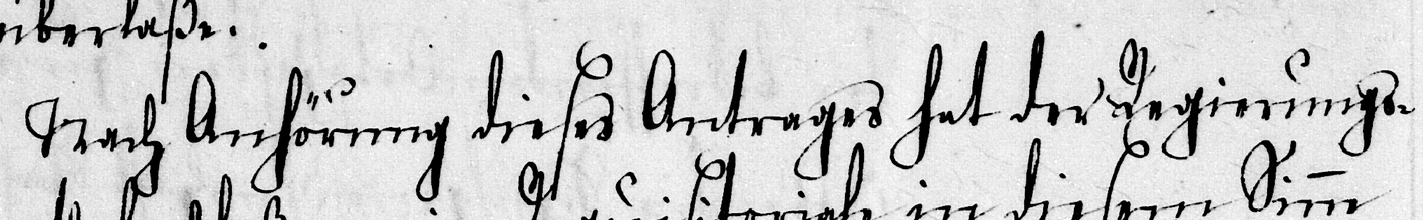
Nach Anhörung dieses Antrages hat der Regierungs¬
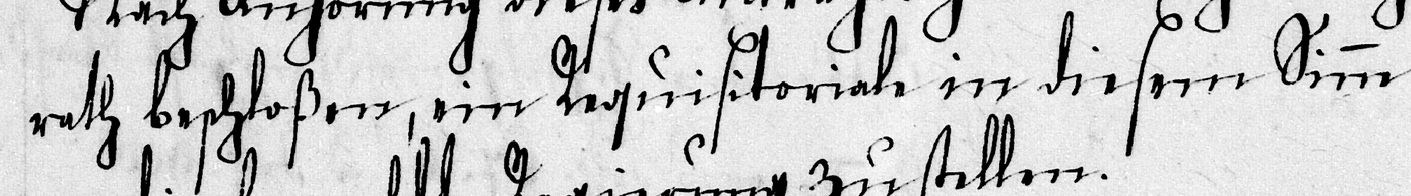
rath beschloßen, ein Requisitoriale in diesem Sinne
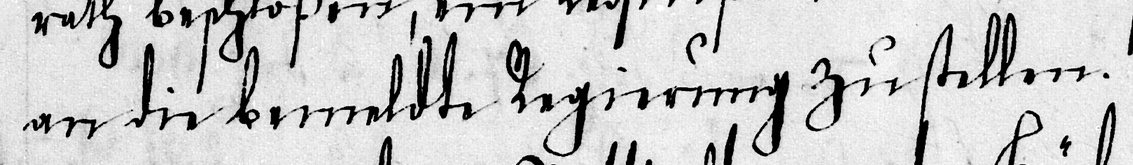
an die bemeldte Regierung zu stellen.
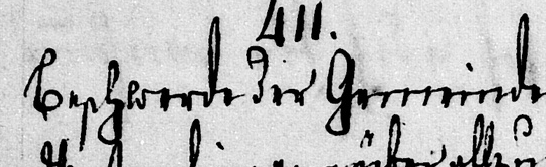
Beschwerde der Gemeind¬
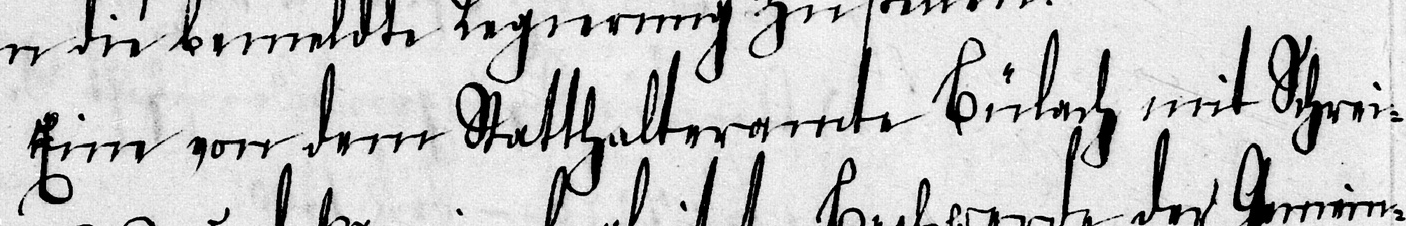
Eine von dem Statthalteramte Bülach mit Schrei¬
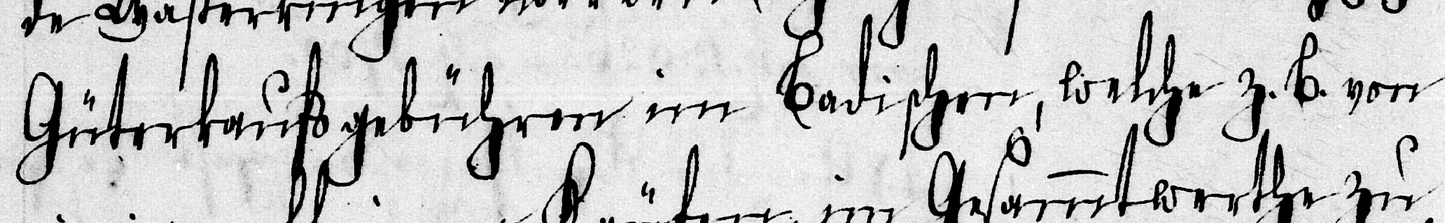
Güterkaufsgebühren im Badischen, welche z. B. von
